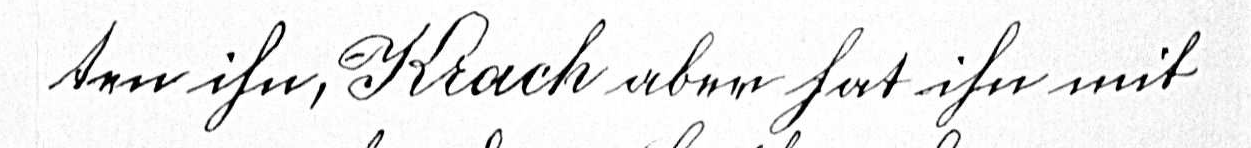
ten ihn, Krach aber hat ihn mit
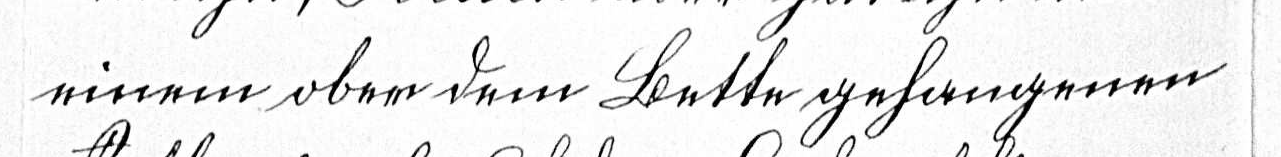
einem ober dem Bette gehangenen
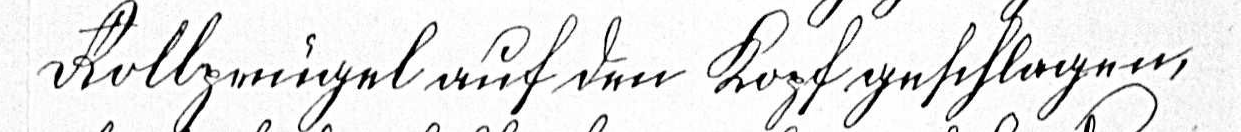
Rollprügel auf den Kopf geschlagen,
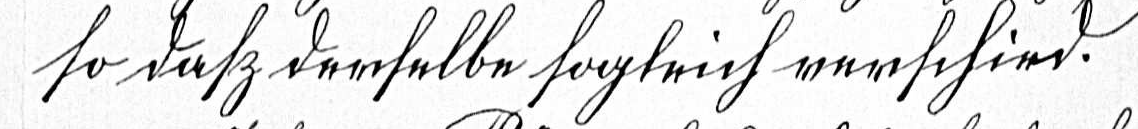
so daß derselbe sogleich verschied.
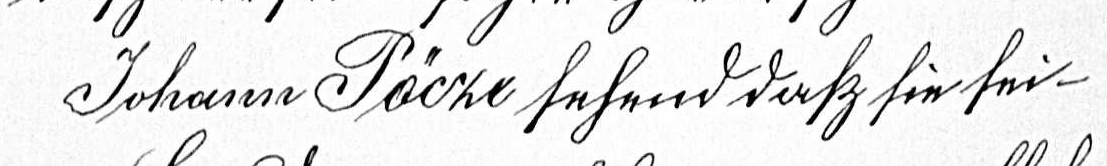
Johann Pöcze sehend daß sie sei¬
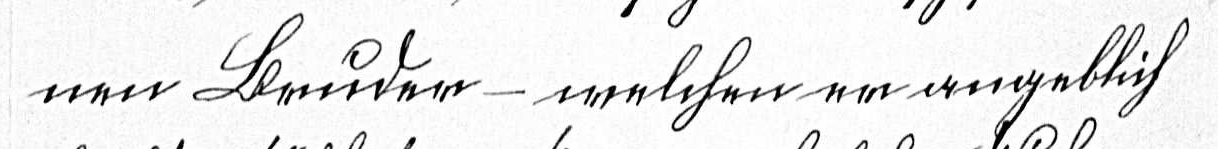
nen Bruder – welchen er angeblich
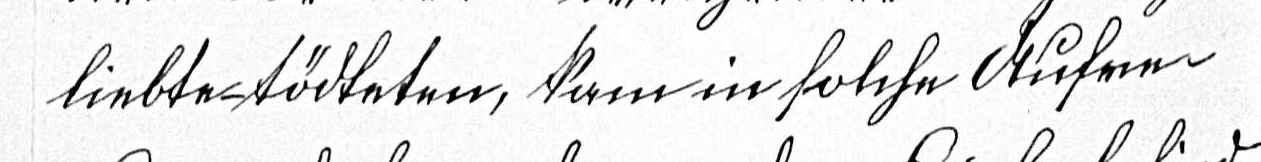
liebte – tödteten, kam in solche Aufre¬
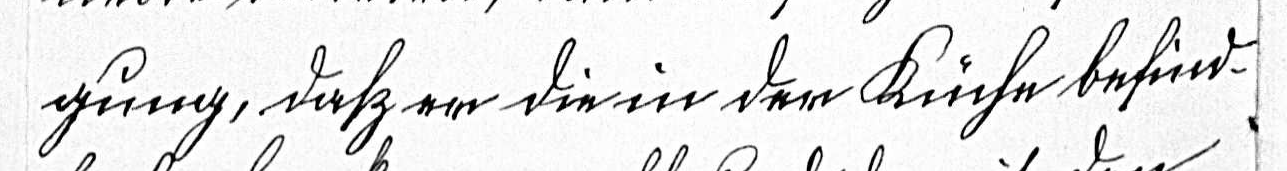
gung, daß er die in der Küche befind¬
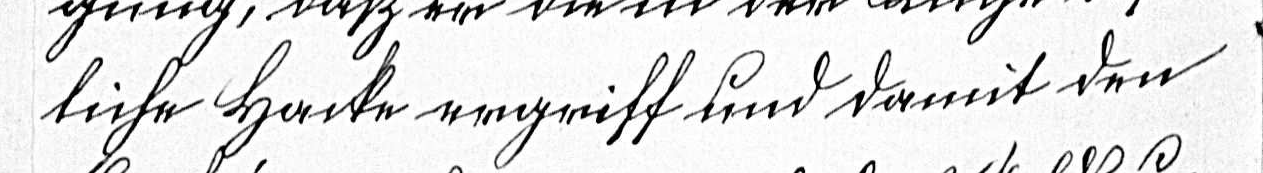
liche Hacke ergriff und damit den
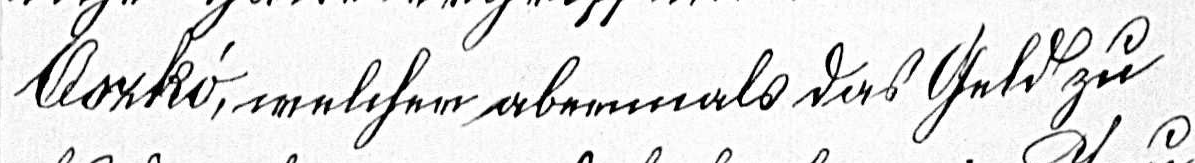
Oszkó, welcher abermals das Geld zu
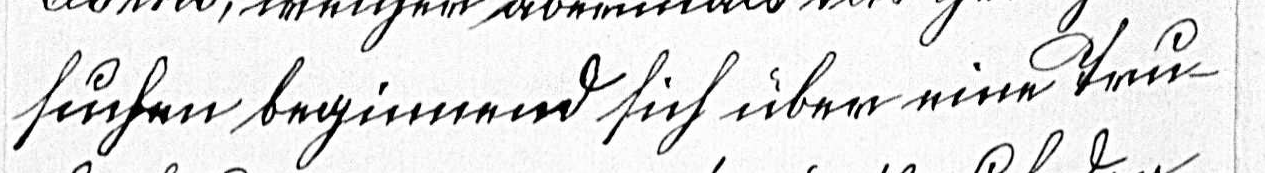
suchen beginnend sich über eine Tru¬
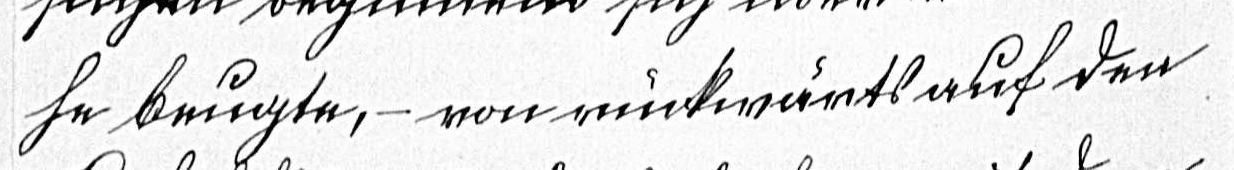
he beugte, -- von rückwärts auf den
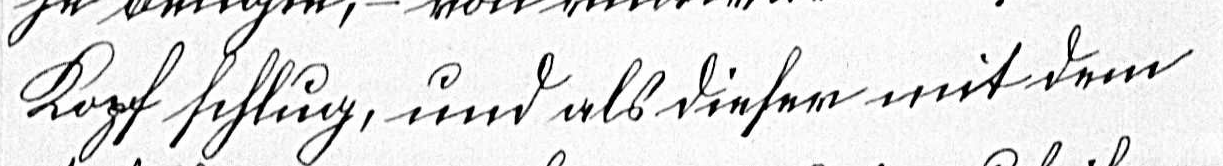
Kopf schlug, und als dieser mit dem
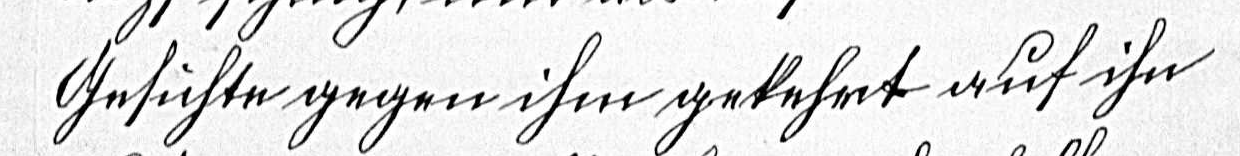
Gesichte gegen ihm gekehrt auf ihn
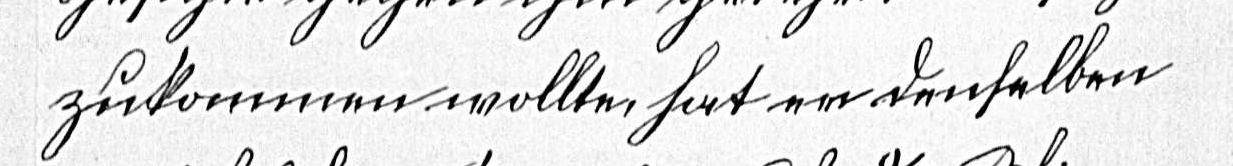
zukommen wollte, hat er denselben
